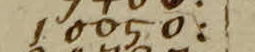10050:
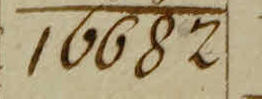16682
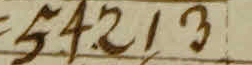54213
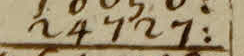24727:
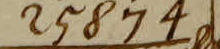25874
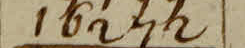16272
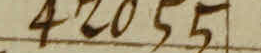42055
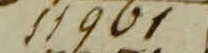11961
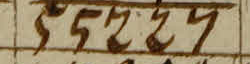55227
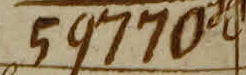59770
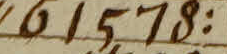61578:
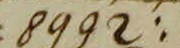8992
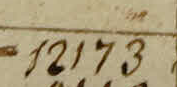12173
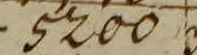5200
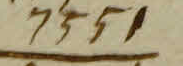7551
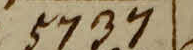5737
